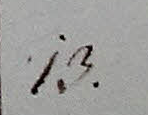13.
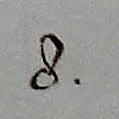8.
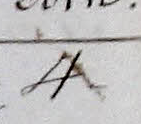4
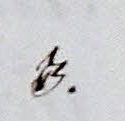3.
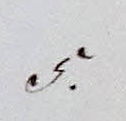5.
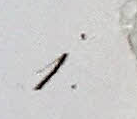1.
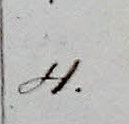4.
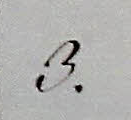3.
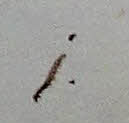1.
